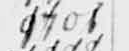9701
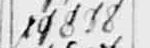19838
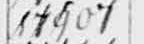17907
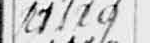27129
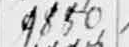9850
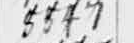5547
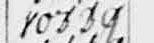10339
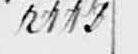2773
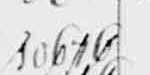10676
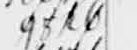9526
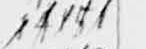14151
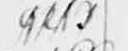9213
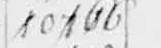10766
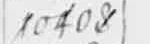10408
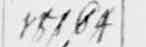15164
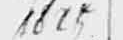1825
